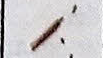1.
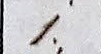1.
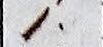1.
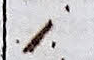1.
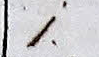1.
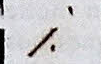1.
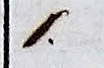1.
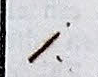1.
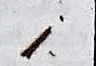1.
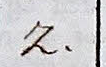2.
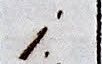1.
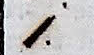1.
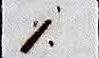1.
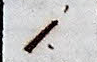1.
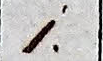1.
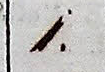1.
